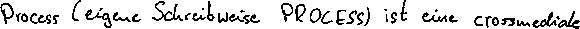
Process (eigene Schreibweise PROCESS) ist eine crossmediale
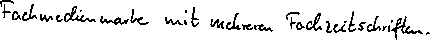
Fachmedienmarke mit mehreren Fachzeitschriften,
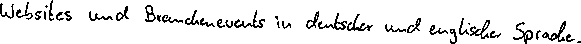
Websites und Branchenevents in deutscher und englischer Sprache.
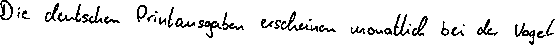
Die deutschen Printausgaben erscheinen monatlich bei der Vogel
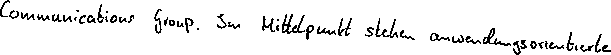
Communications Group. Im Mittelpunkt stehen anwendungsorientierte
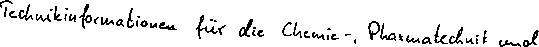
Technikinformationen für die Chemie-, Pharmatechnik und
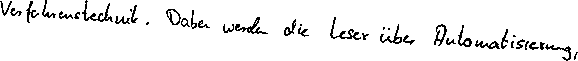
Verfahrenstechnik. Dabei werden die Leser über Automatisierung,
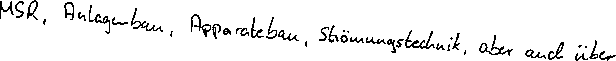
MSR, Anlagenbau, Apparatebau, Strömungstechnik, aber auch über
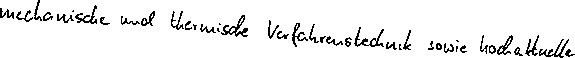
mechanische und thermische Verfahrenstechnik sowie hochaktuelle
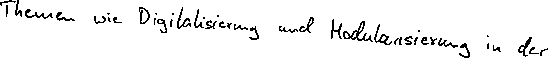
Themen wie Digitalisierung und Modularisierung in der
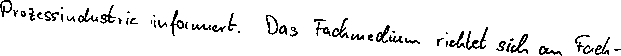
Prozessindustrie informiert. Das Fachmedium richtet sich an Fach-
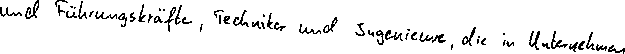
und Führungskräfte, Techniker und Ingenieure, die in Unternehmen
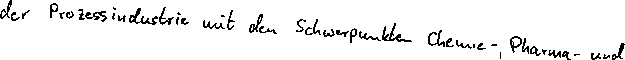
der Prozessindustrie mit den Schwerpunkten Chemie-, Pharma- und
